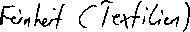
Feinheit (Textilien)
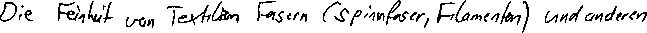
Die Feinheit von textilen Fasern (Spinnfasern, Filamenten) und anderen
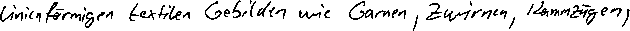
linienförmigen textilen Gebilden wie Garnen, Zwirnen, Kammzügen,
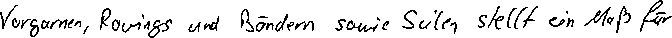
Vorgarnen, Rovings und Bändern sowie Seilen stellt ein Maß für
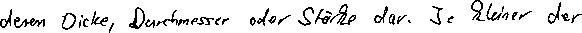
deren Dicke, Durchmesser oder Stärke dar. Je kleiner der
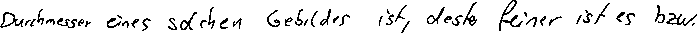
Durchmesser eines solchen Gebildes ist, desto feiner ist es bzw.
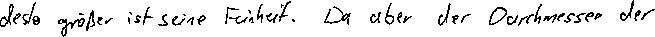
desto größer ist seine Feinheit. Da aber der Durchmesser der
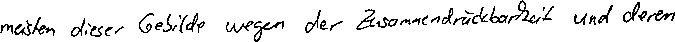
meisten dieser Gebilde wegen der Zusammendrückbarkeit und deren
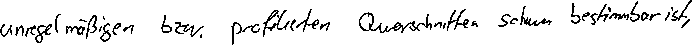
unregelmäßigen bzw. profilierten Querschnitten schwer bestimmbar ist,
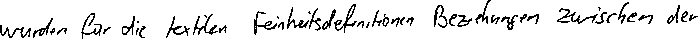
wurden für die textilen Feinheitsdefinitionen Beziehungen zwischen der
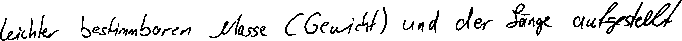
leichter bestimmbaren Masse (Gewicht) und der Länge aufgestellt.
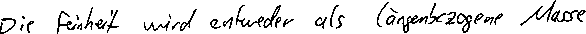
Die Feinheit wird entweder als längenbezogene Masse
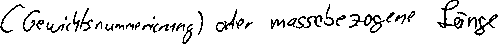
(Gewichtsnummerierung) oder massebezogene Länge
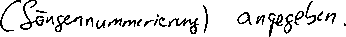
(Längennummerierung) angegeben.
